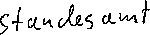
Standesamt
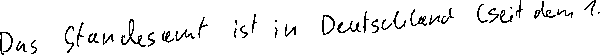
Das Standesamt ist in Deutschland (seit dem 1.
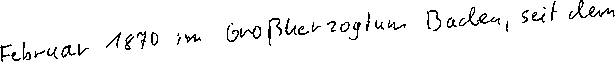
Februar 1870 im Großherzogtum Baden, seit dem
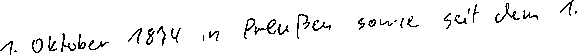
1. Oktober 1874 in Preußen sowie seit dem 1.
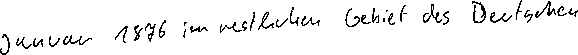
Januar 1876 im restlichen Gebiet des Deutschen
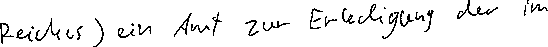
Reiches) ein Amt zur Erledigung der im
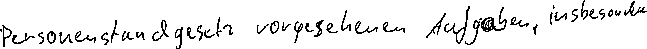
Personenstandsgesetz vorgesehenen Aufgaben, insbesondere
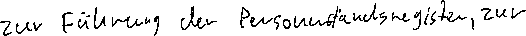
zur Führung der Personenstandsregister, zur
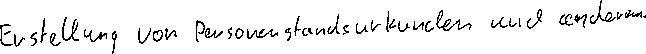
Erstellung von Personenstandsurkunden und anderem.
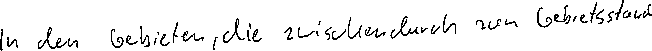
In den Gebieten, die zwischendurch zum Gebietsstand
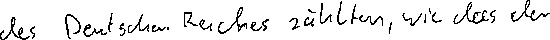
des Deutschen Reiches zählten, wie das der
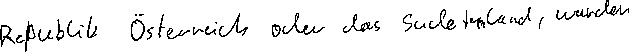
Republik Österreich oder das Sudetenland, wurden
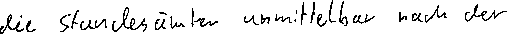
die Standesämter unmittelbar nach der
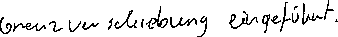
Grenzverschiebung eingeführt.
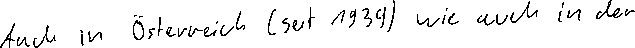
Auch in Österreich (seit 1939) wie auch in der
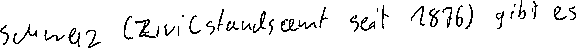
Schweiz (Zivilstandsamt seit 1876) gibt es
